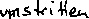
umstritten.
